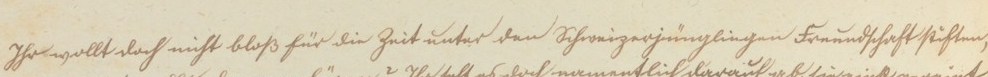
Ihr wollt doch nicht bloß für die Zeit unter den Schweizerjünglingen Freundschaft stiften,
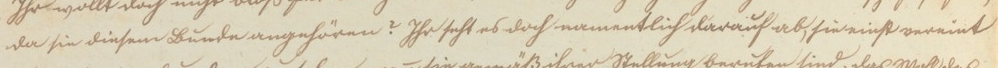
da sie diesem Bunde angehören? Ihr seht es doch namentlich darauf ab, sie einst vereint
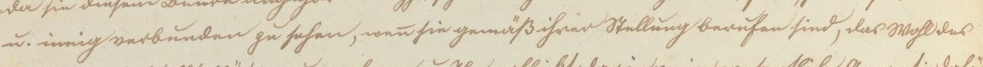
u. innig verbunden zu sehen, wenn sie gemäß ihrer Stellung berufen sind, das Wohl des
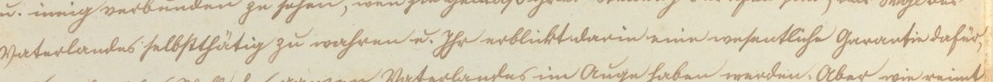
Vaterlandes selbstthätig zu wahren u. Ihr erblickt darin eine wesentliche Garantie dafür,
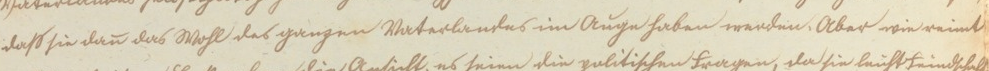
dass sie dann das Wohl des ganzen Vaterlandes im Auge haben werden. Aber wie reimt
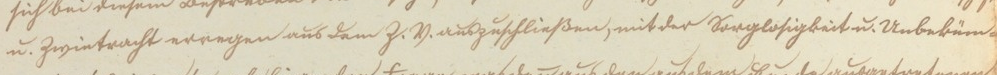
u. Zwietracht erregen aus dem Z.V. auszuschließen, mit der Sorglosigkeit u. Unbeküm-
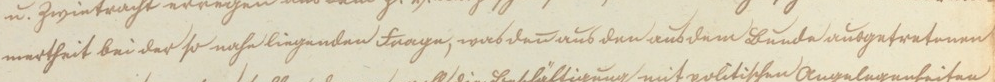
mertheit bei der so nahe liegenden Frage, was denn aus den aus dem Bunde ausgetretenen
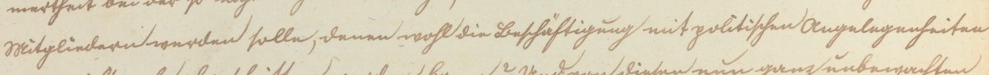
Mitgliedern werden solle, denen wohl die Beschäftigung mit politischen Angelegenheiten
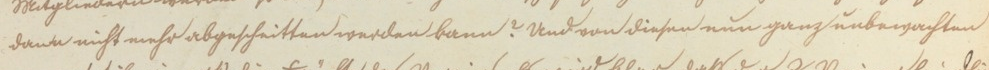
dann nicht mehr abgeschnitten werden kann? Und von diesen nun ganz unbewachten
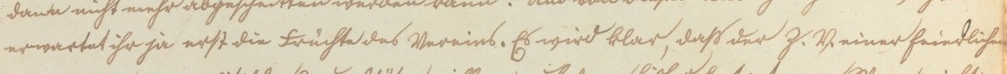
erwartet ihr ja erst die Früchte des Vereins. Es wird klar, dass der Z.V. einer feindlichen
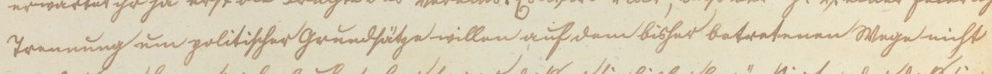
Trennung um politischer Grundsätze willen auf dem bisher betretenen Wege nicht
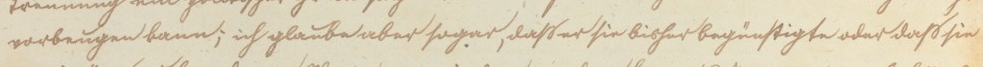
vorbeugen kann; ich glaube aber sogar, dass er sie bisher begünstigte oder dass sie
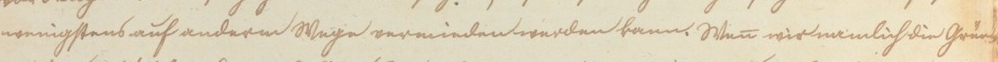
wenigstens auf anderem Wege vermieden werden kann. Wenn wir namlich die Grün-
